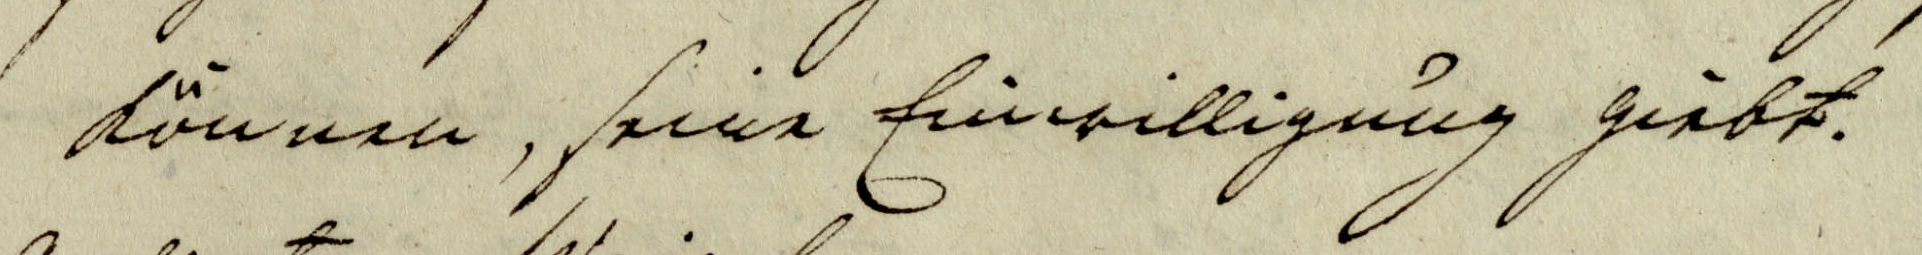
können, seine Einwilligung giebt.
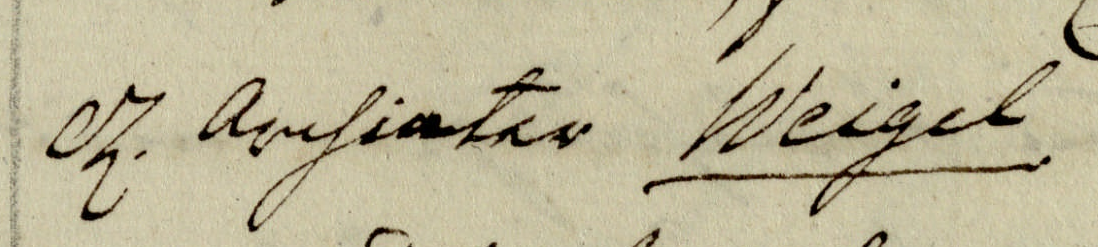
dh. Archiater Weigel
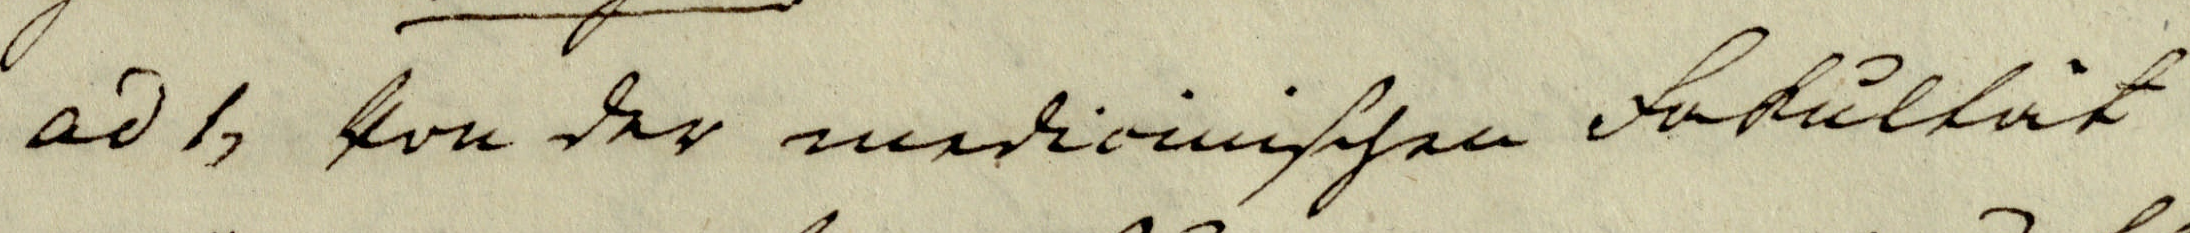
ad 1., Von der medicinischen Fakultät
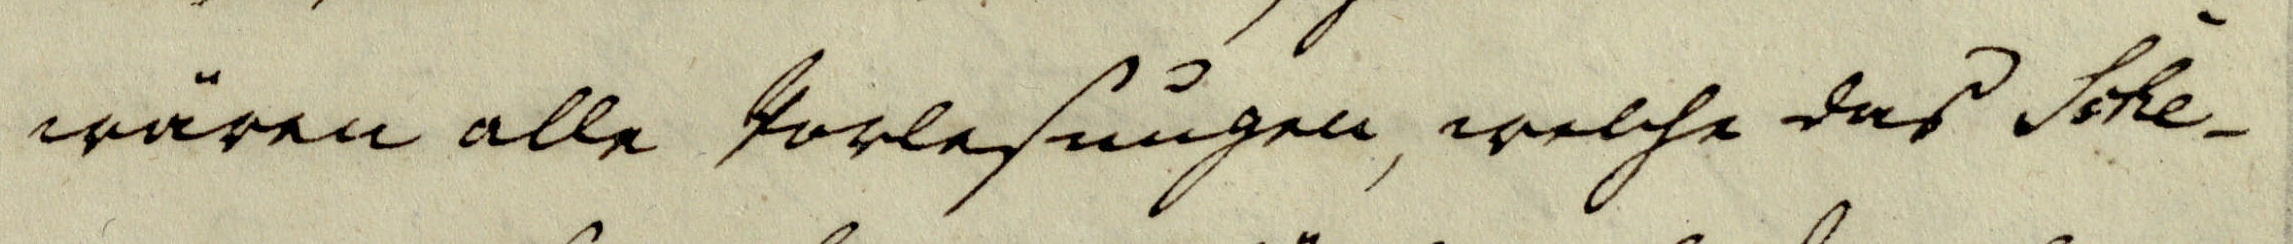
wären alle Vorlesungen, welche das Sche¬
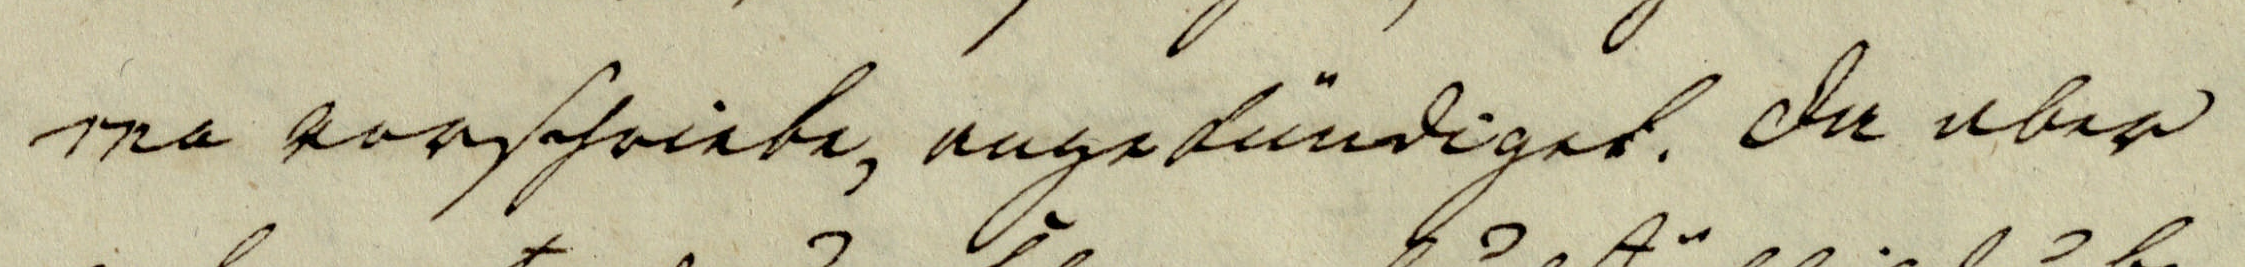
ma vorschriebe, angekündiget. Da aber
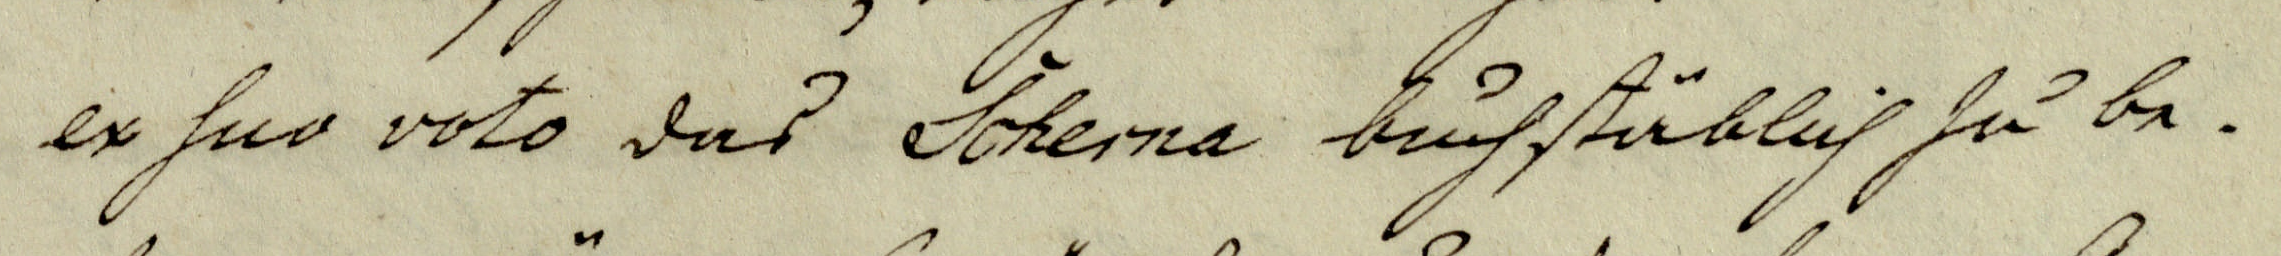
ex suo voto das Schema buchstäblich zu be¬
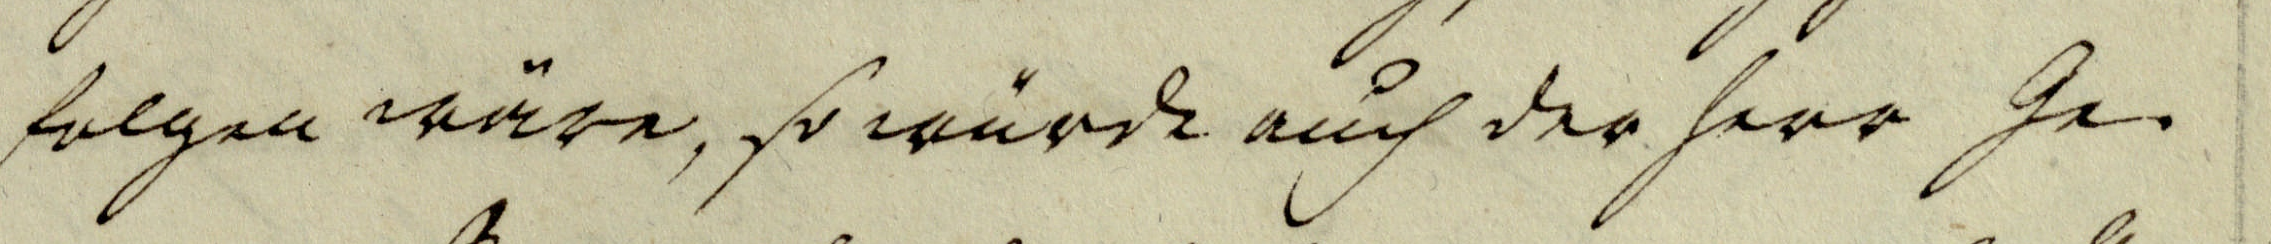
folgen wäre, so würde auch der Herr Ge¬
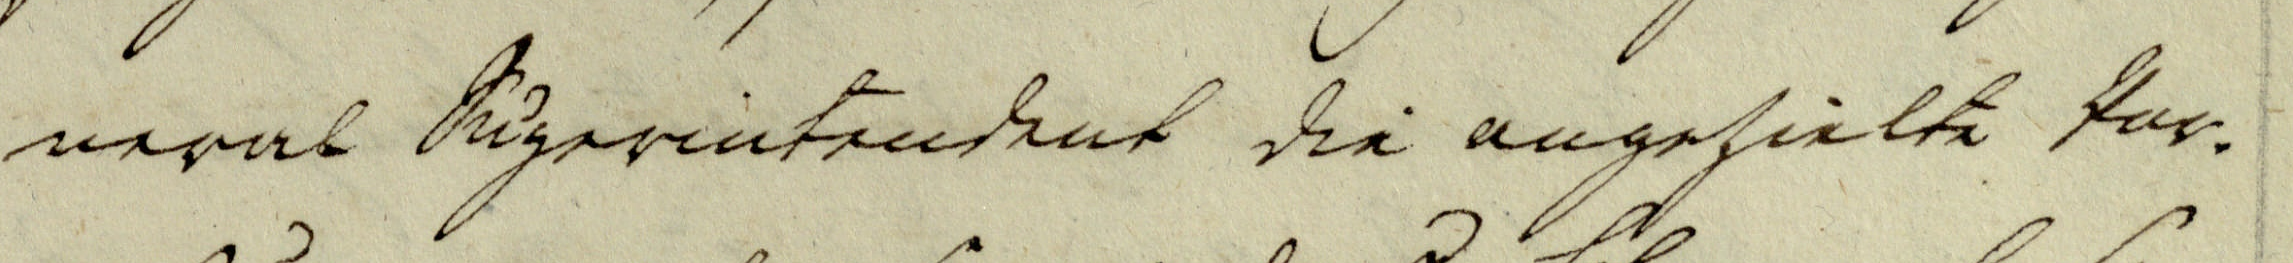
neral Superintendent die angezielte Vor¬
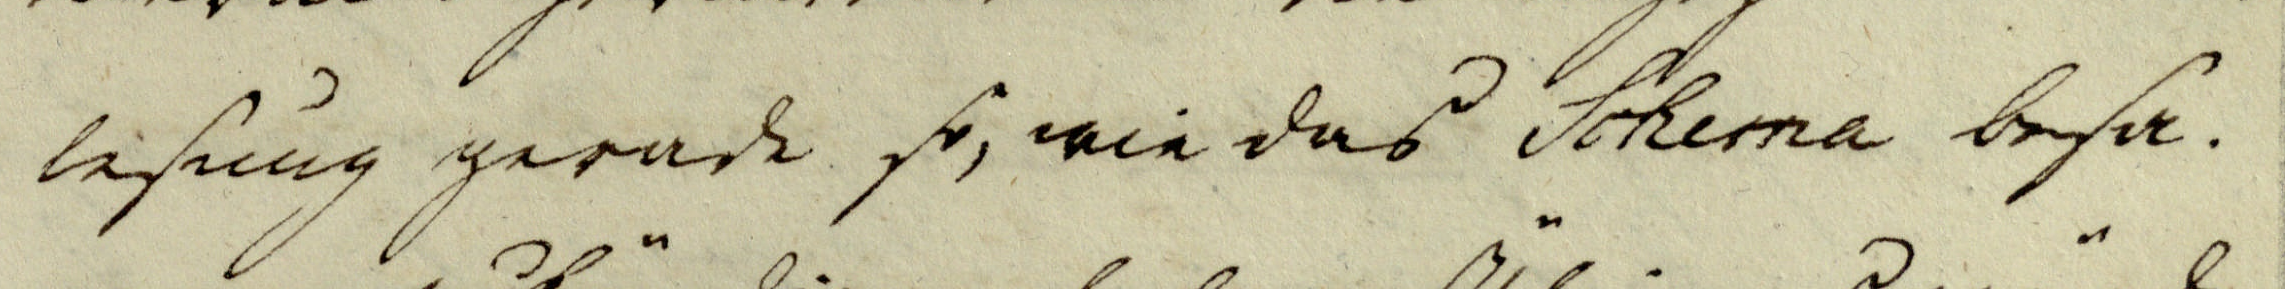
lesung gerade so, wie das Schema besa¬
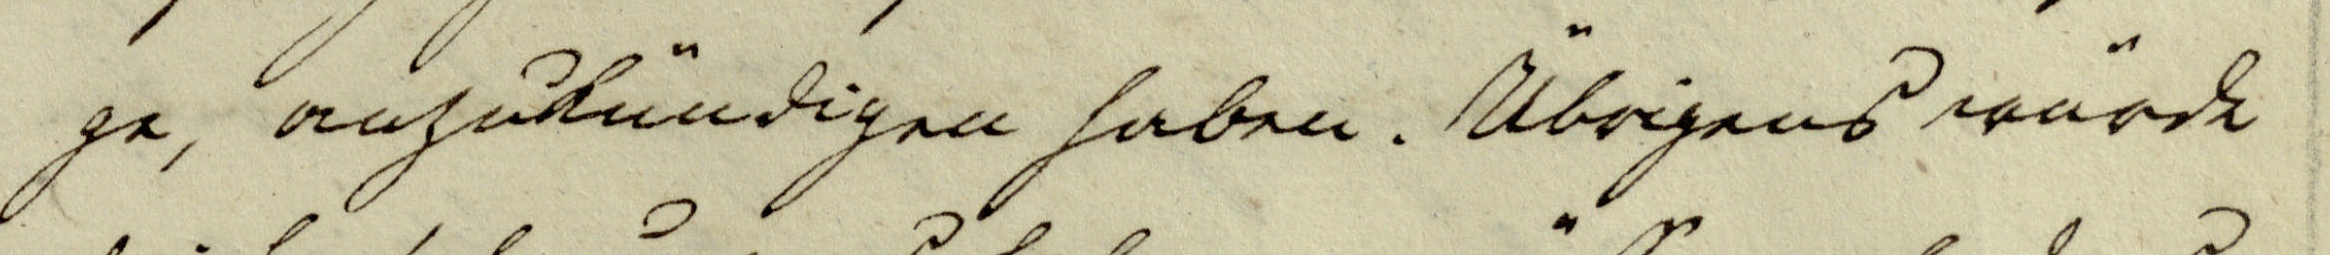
ge, anzukündigen haben. Übrigens würde
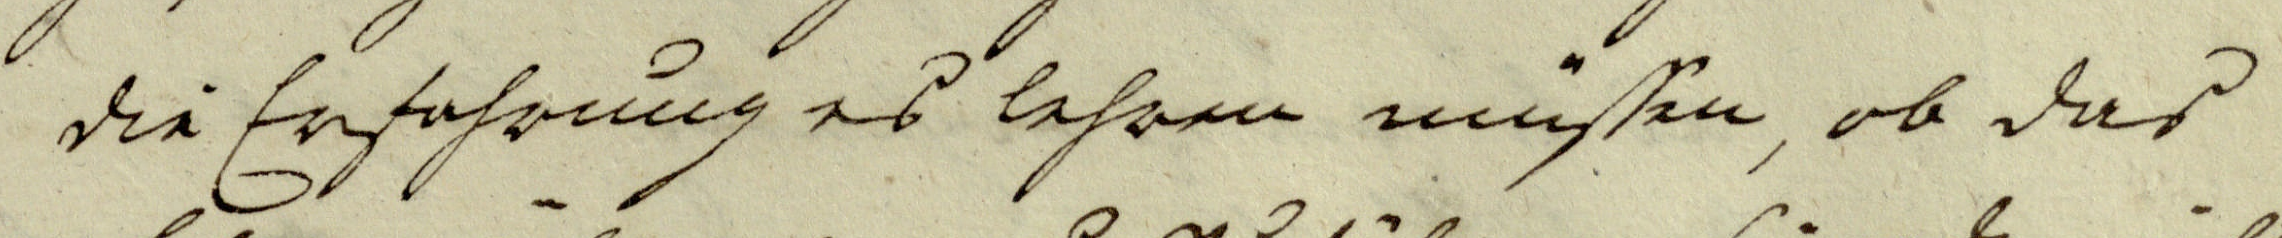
die Erfahrung es lehren müssen, ob das
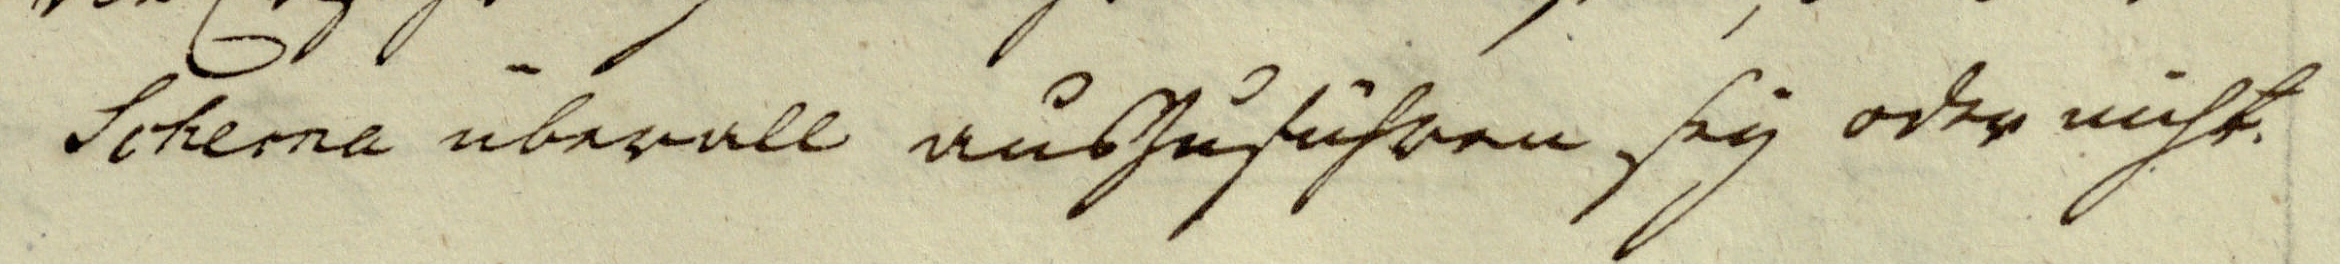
Schema überall auszuführen seÿ oder nicht.
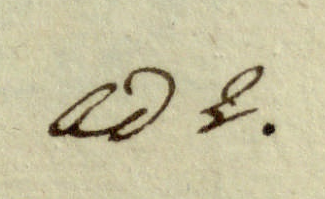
ad 2.
